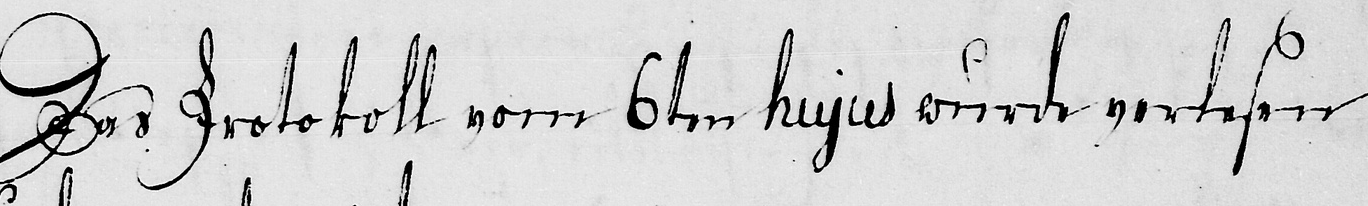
Das Protokoll vom 6ten hujus wurde verlesen
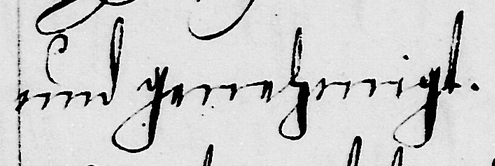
und genehmigt.
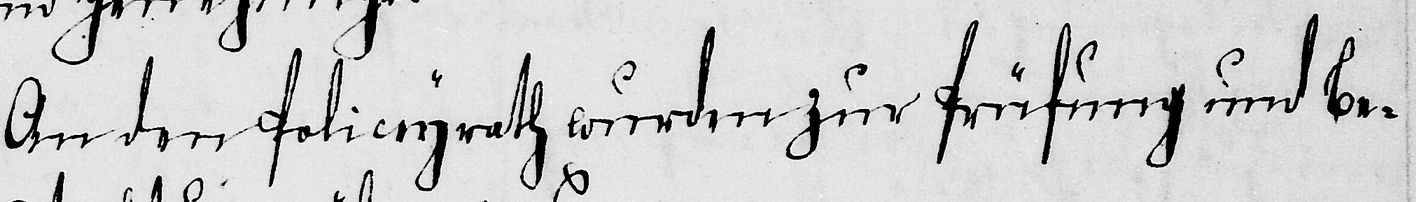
An den Policeyrath wurden zur Prüfung und Be¬
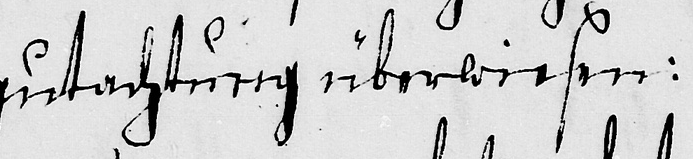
gutachtung überwiesen:
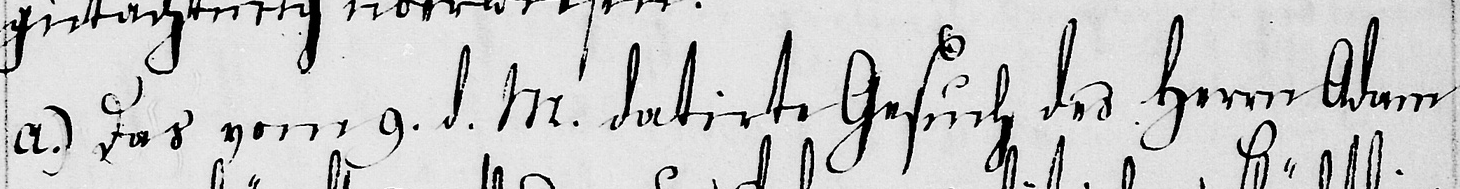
a.) Das vom 9. d. M. datirte Gesuch des Herrn Adam
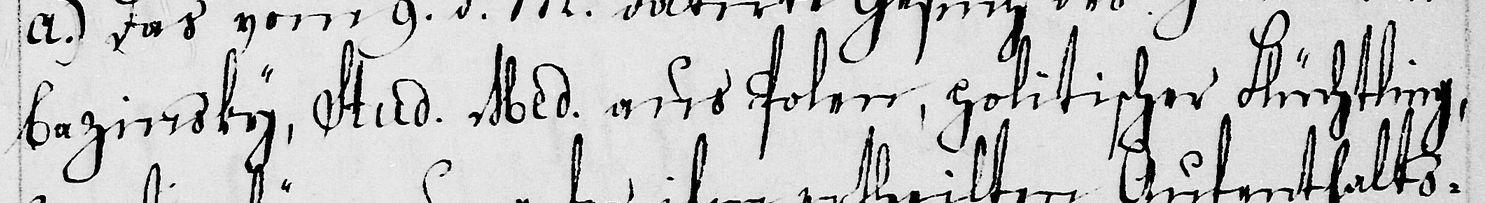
Bazinsky, Stud. Med. aus Polen, politischer Flüchtling,
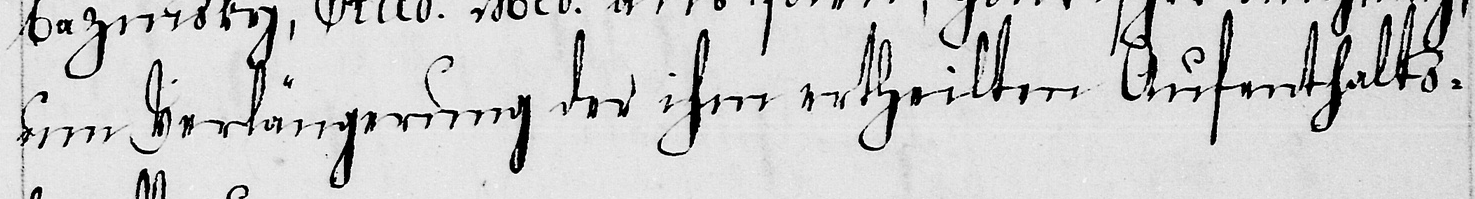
um Verlängerung der ihm ertheilten Aufenthalts¬
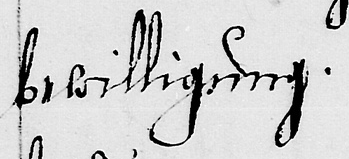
bewilligung.
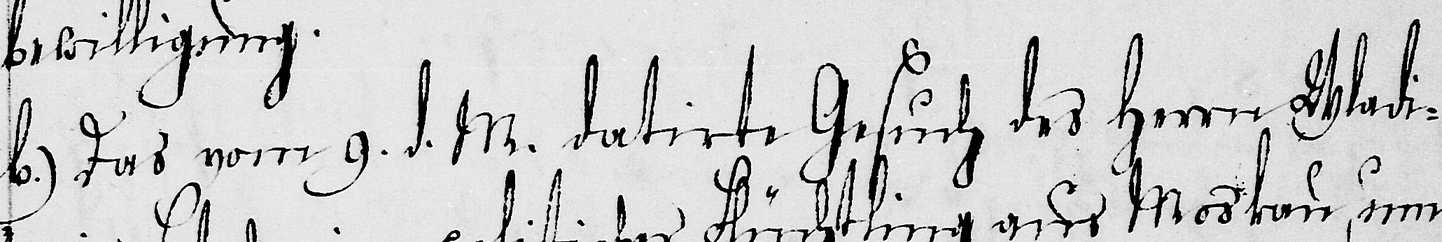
b.) Das vom 9. d. M. datirte Gesuch des Herrn Wladi¬
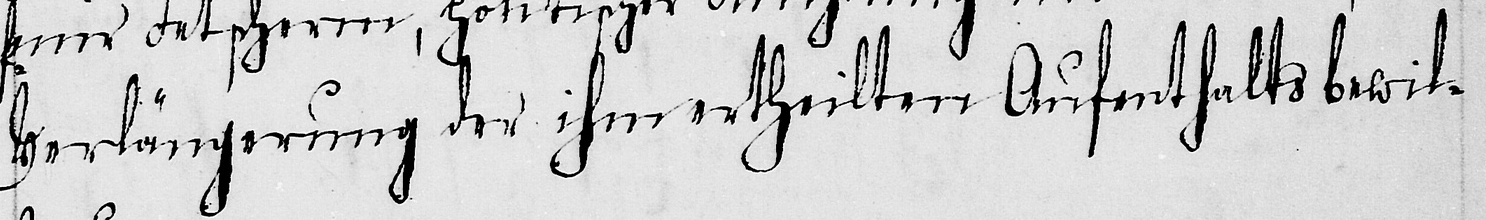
Verlängerung der ihm ertheilten Aufenthaltsbewil¬
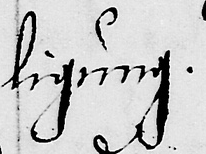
ligung.
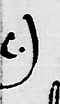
d.)
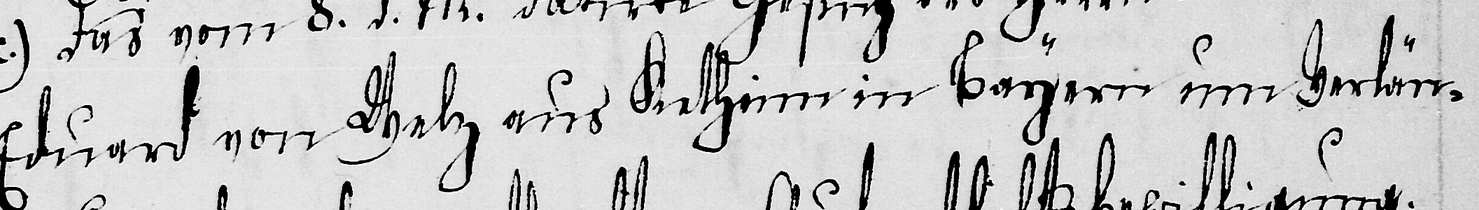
Eduard von Welz aus Ketheim in Bayern um Verlän¬
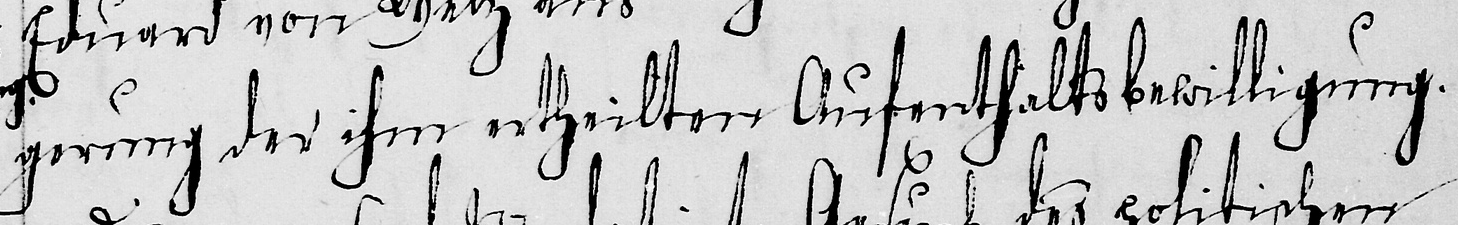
gerung der ihm ertheilten Aufenthaltsbewilligung.
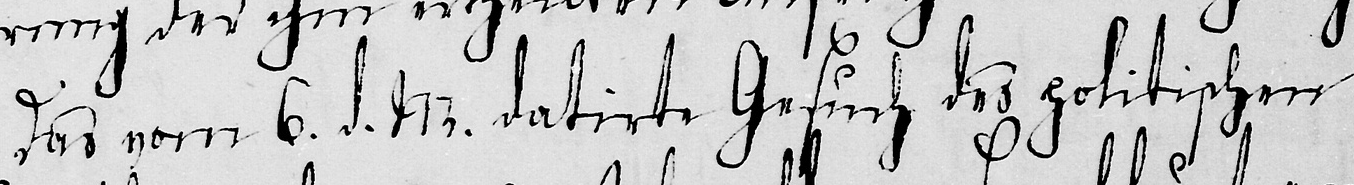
Das vom 6. d. M. datirte Gesuch des politischen
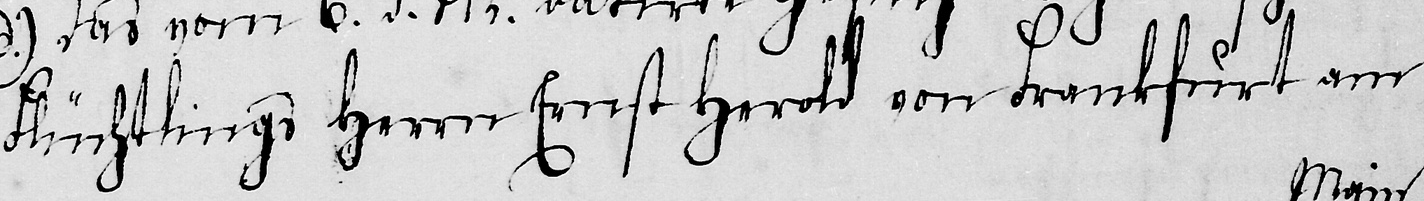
Flüchtlings Herrn Ernst Herold von Frankfurt am
